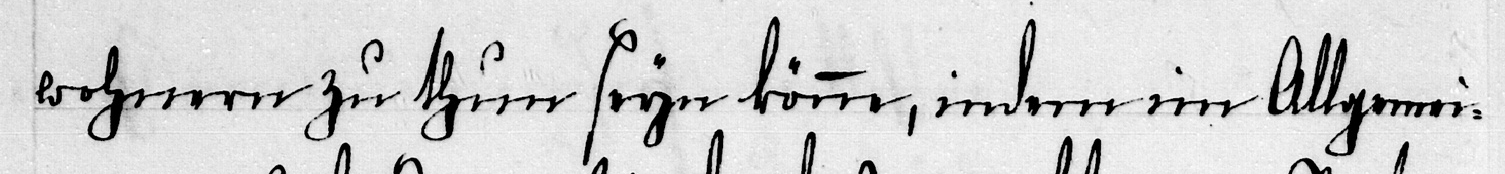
wohnern zu thun seyn könne, indem im Allgemei¬
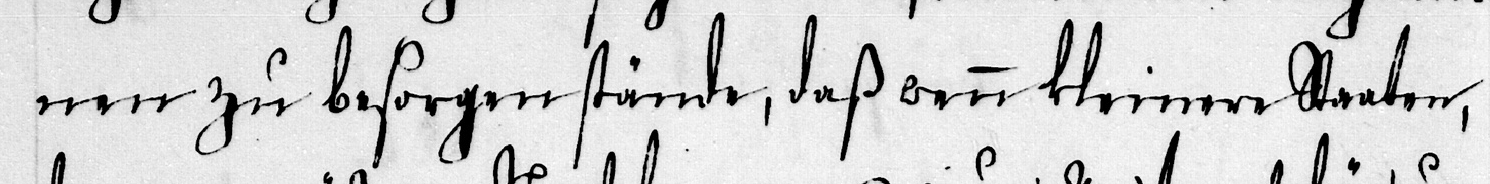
nen zu besorgen stände, daß wenn kleinere Staaten,
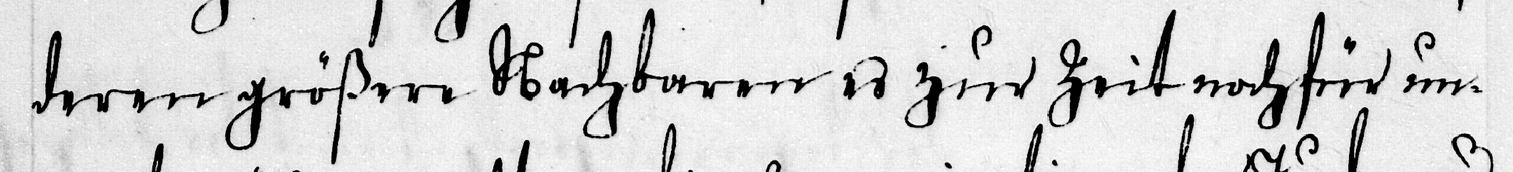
deren größere Nachbaren es zur Zeit noch für un¬
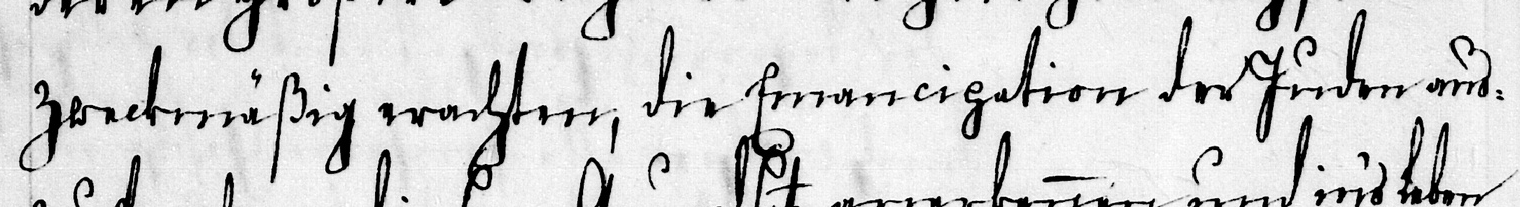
zweckmäßig erachten, die Emancipation der Juden aus¬
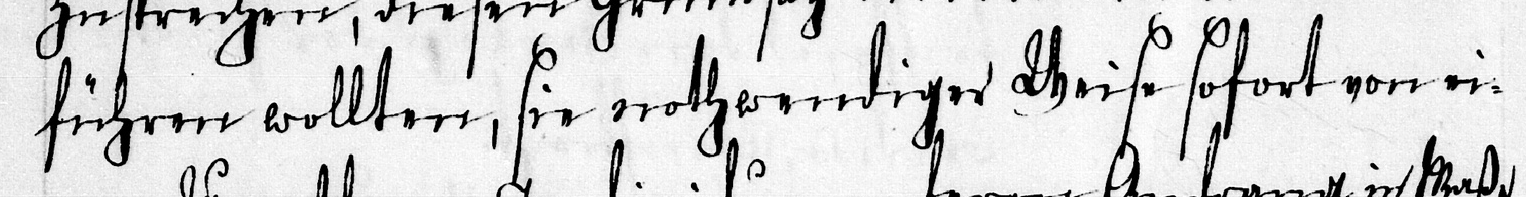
führen wollten, sie nothwendiger Weise sofort von ei¬
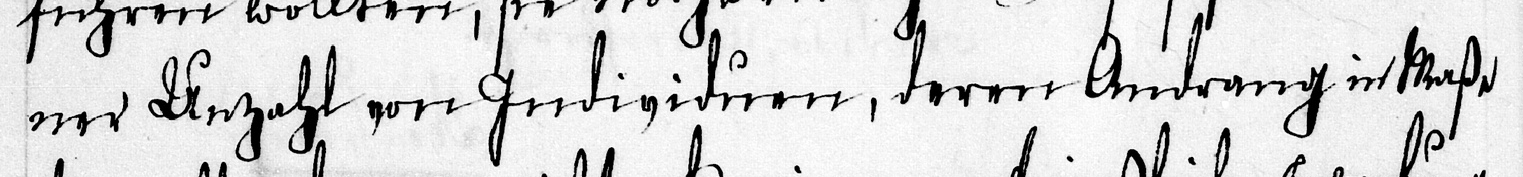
ner Unzahl von Individuen, deren Andrang in Maße
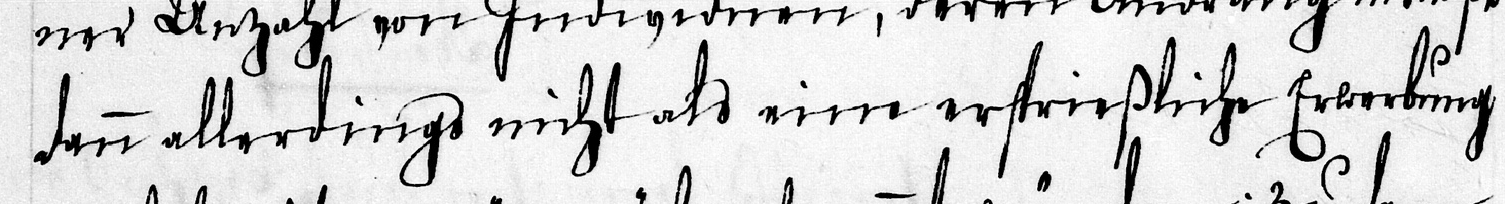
dann allerdings nicht als eine ersprießliche Erwerbung
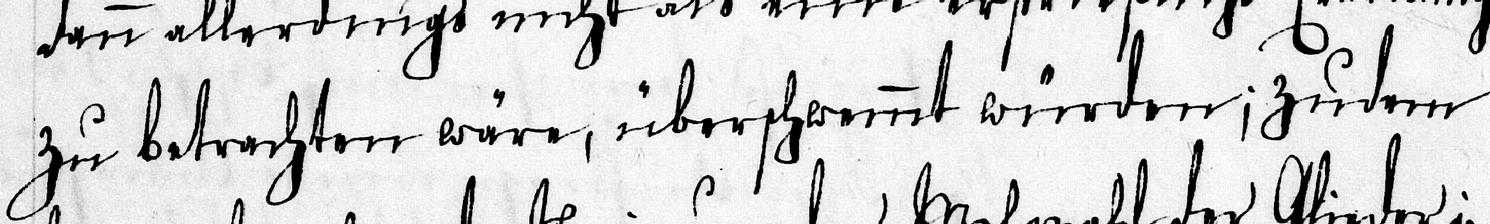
zu betrachten wäre, überschwemmt würden; zudem
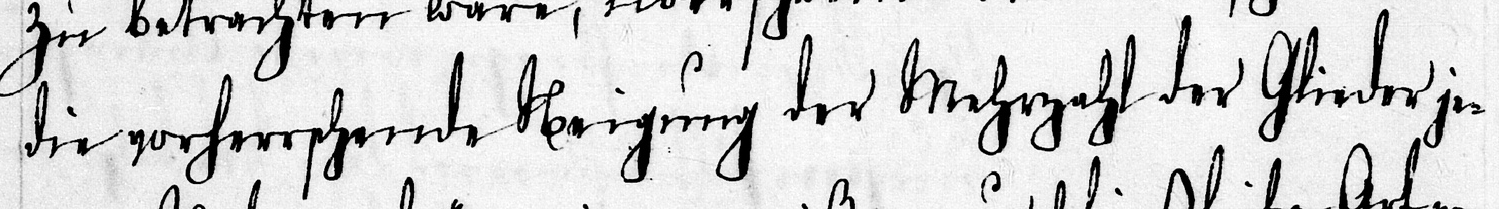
die vorherrschende Neigung der Mehrzahl der Glieder je¬
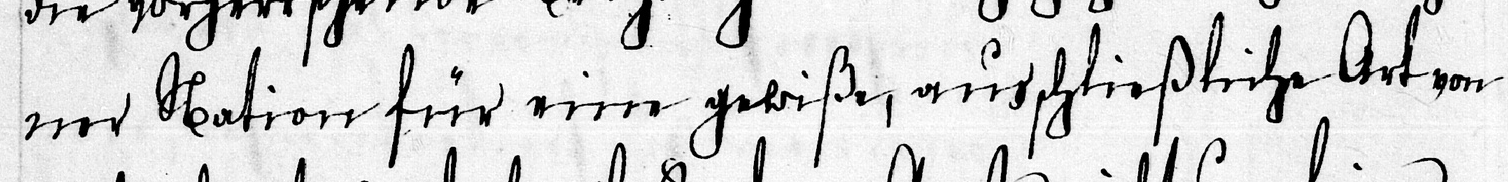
ner Nation für eine gewiße, ausschließliche Art von
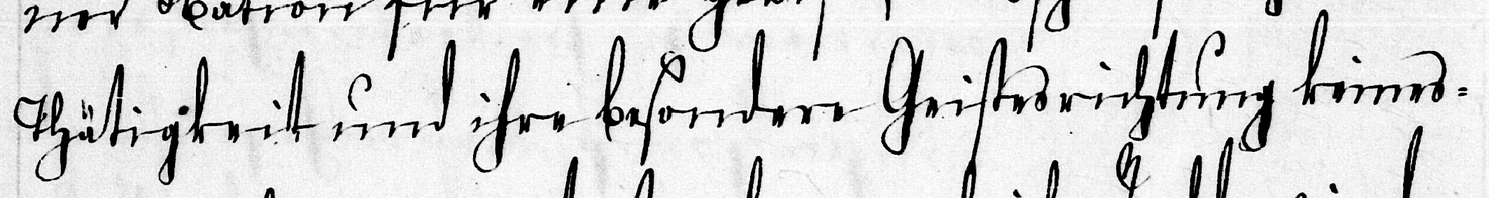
Thätigkeit und ihre besondere Geistesrichtung keines¬
